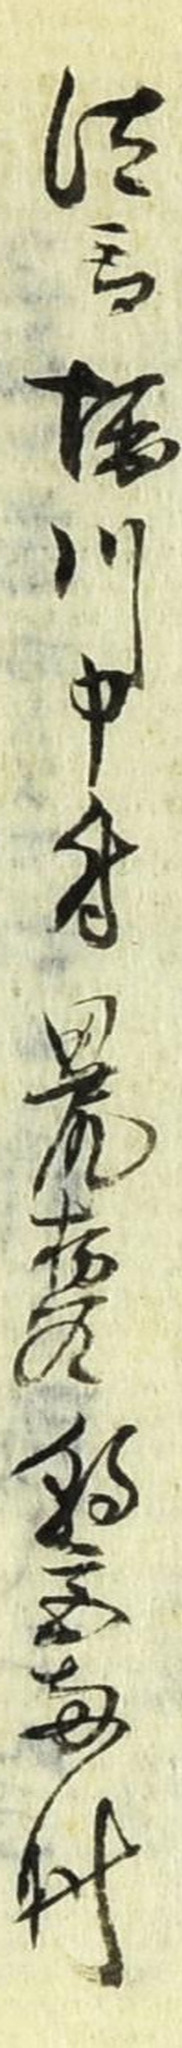汰に而堀川申付田尻栃谷朝宮両村
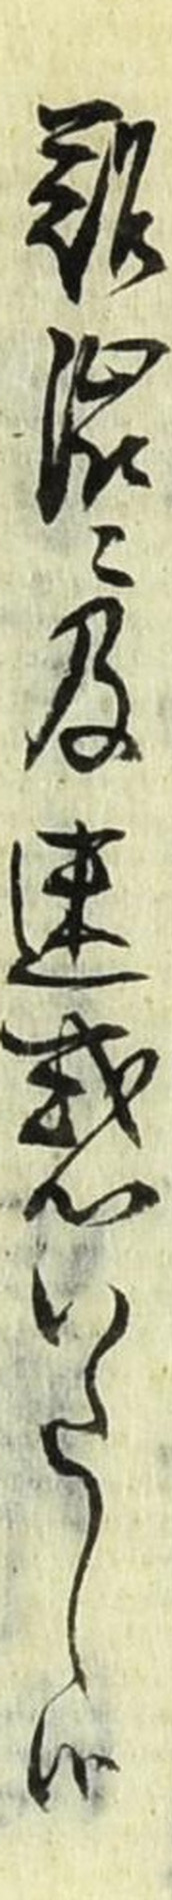難渋に及迷惑いたし候
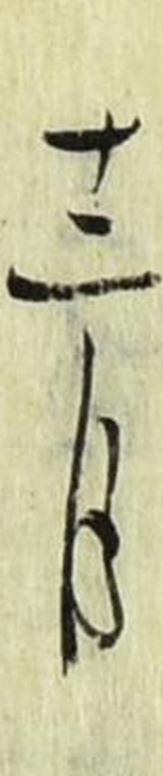十二月
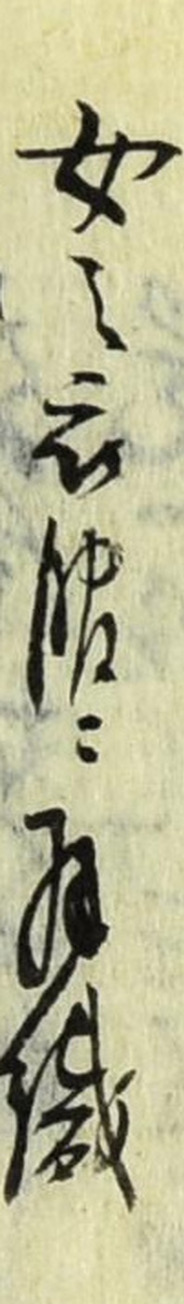女之衣服に羽織
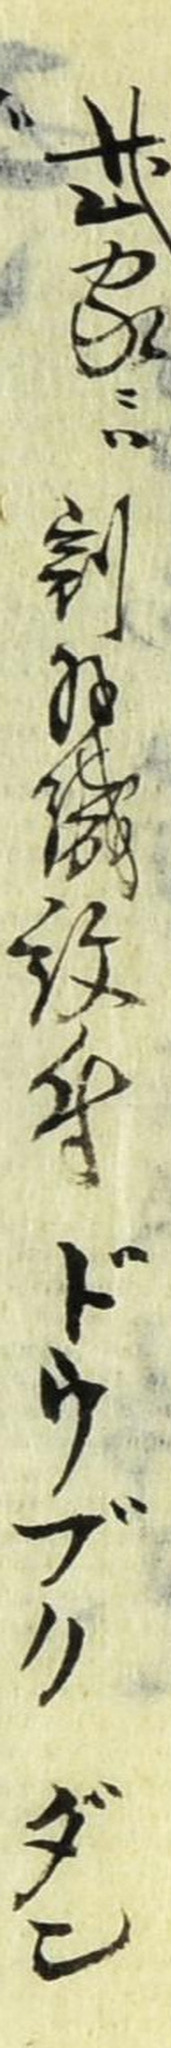武家には割羽織紋付ドウブクダン
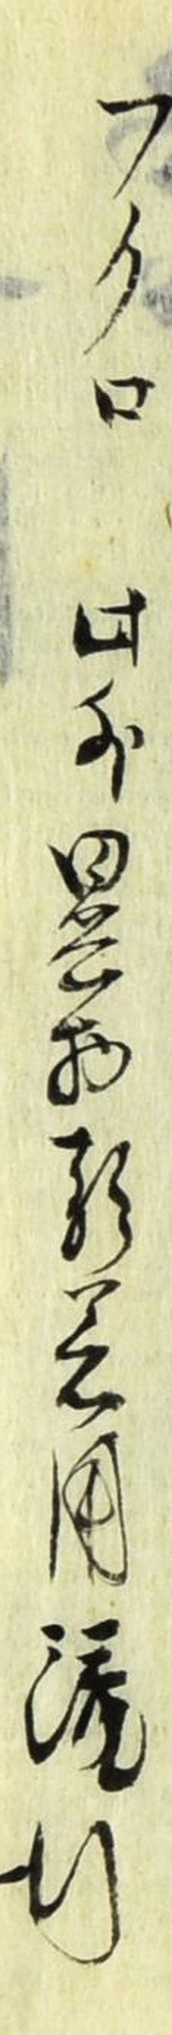ブクロ此外異物類着用流行

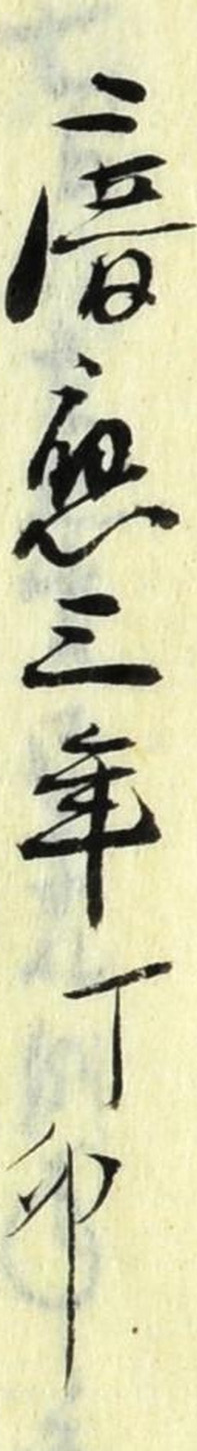慶応三年丁卯
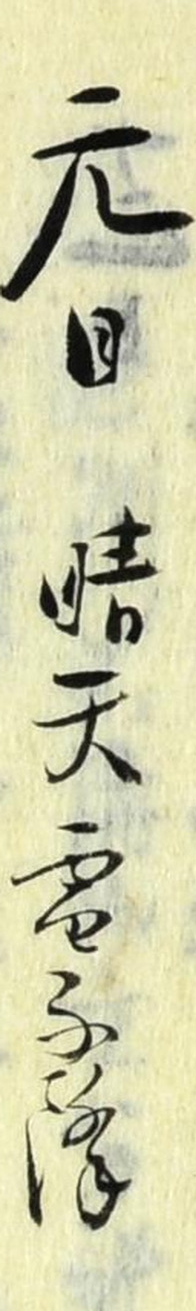元日晴天雪不降
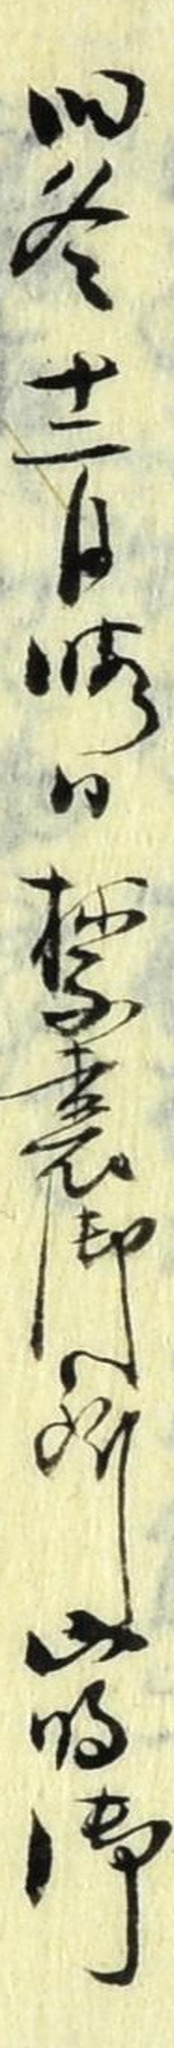旧冬十二月晦日禁裏御所崩御
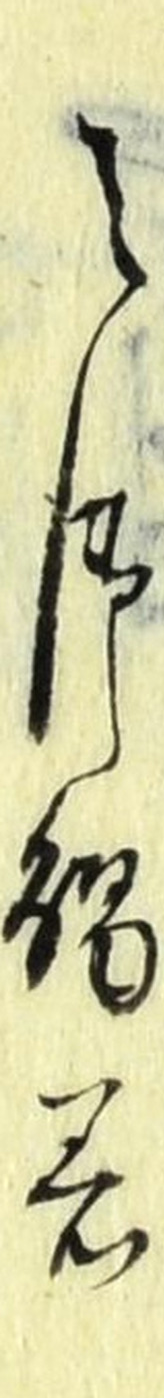之御触着
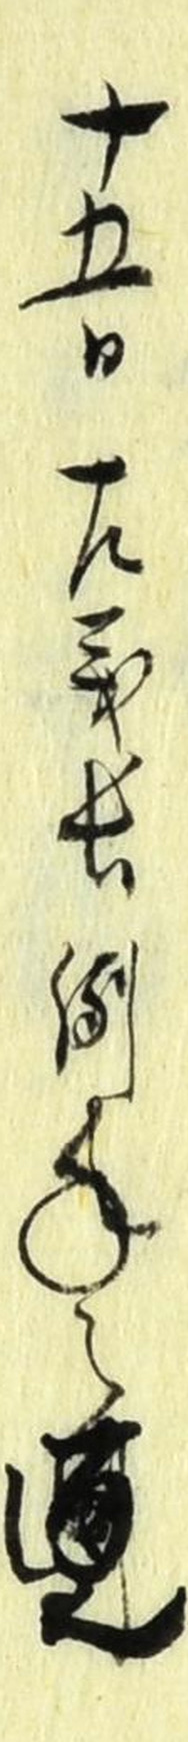十五日左義長例年之通也
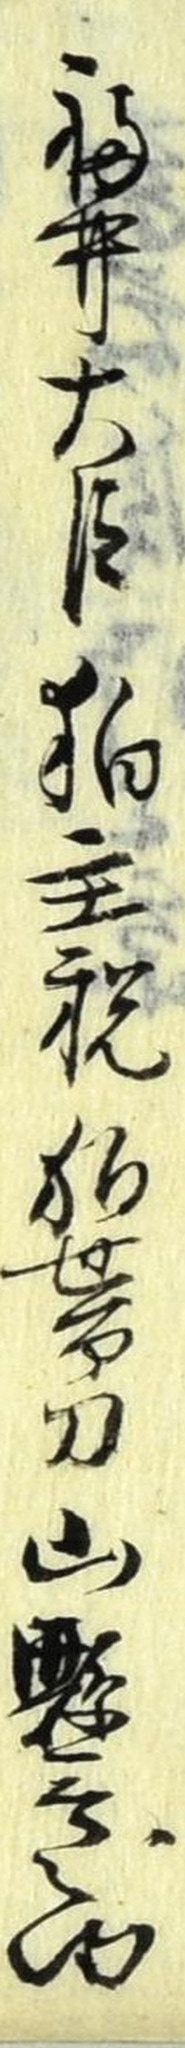福井大臣狛主税狛帯刀山県三郎兵衛
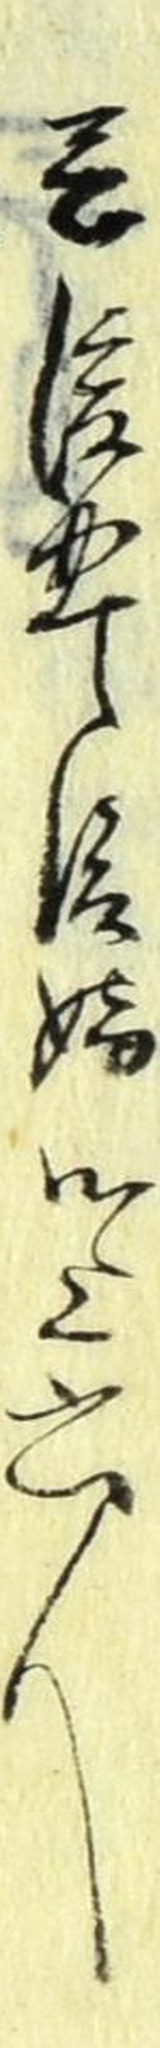岡倍豊後嫡以上六人
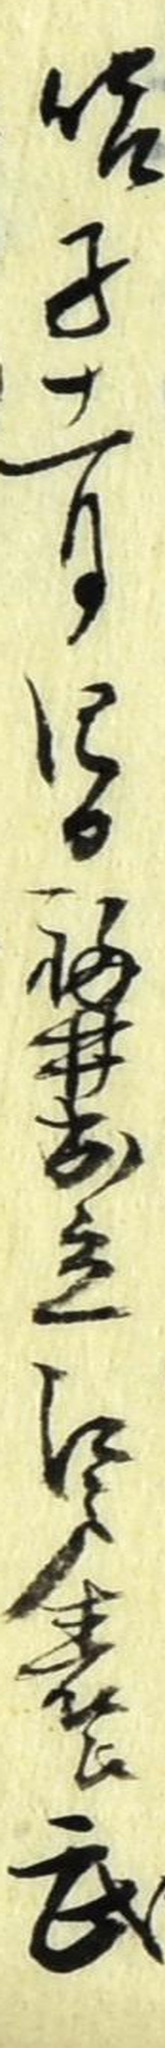昨刁十一月四日福井出立江戸表武
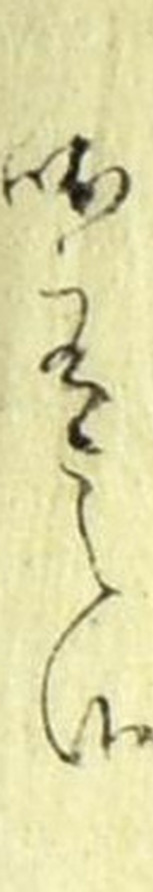咄有之候

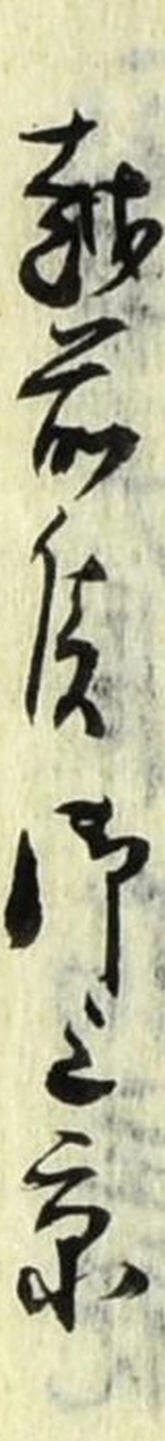越前侯御上京
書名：（日記）
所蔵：福井県文書館 Fukui Prefectural Archives
